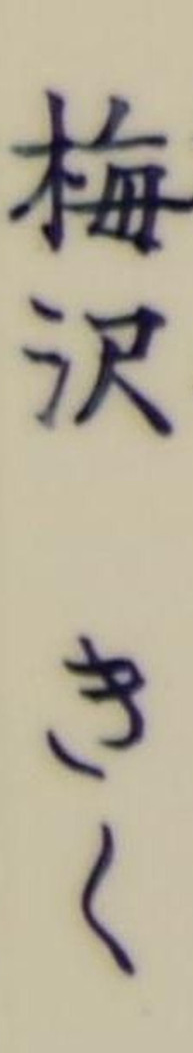梅沢きく

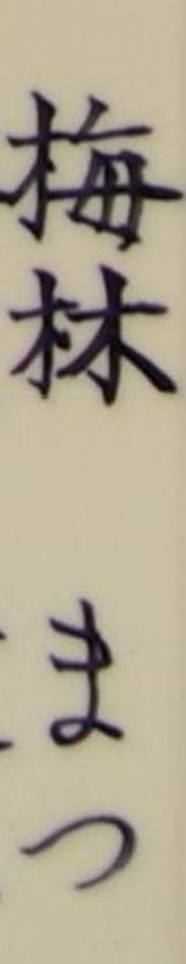梅林まつ
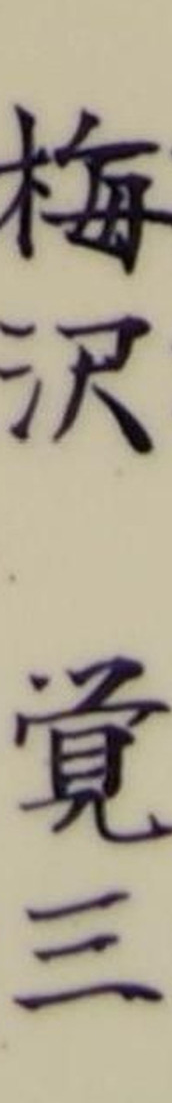梅沢覚三
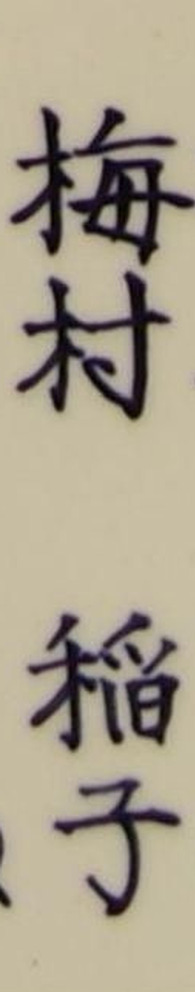梅村稲子
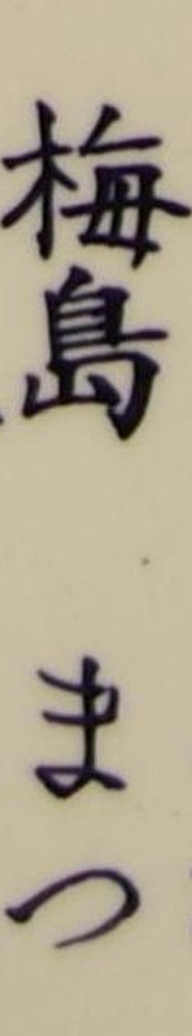梅島まつ
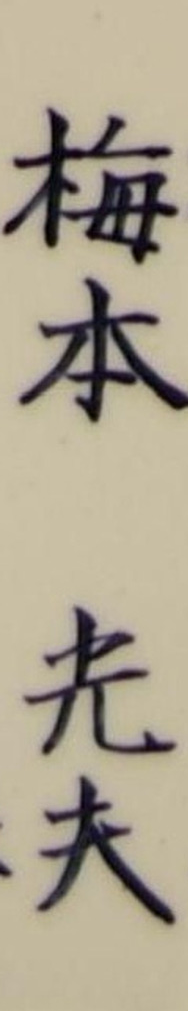梅本光夫
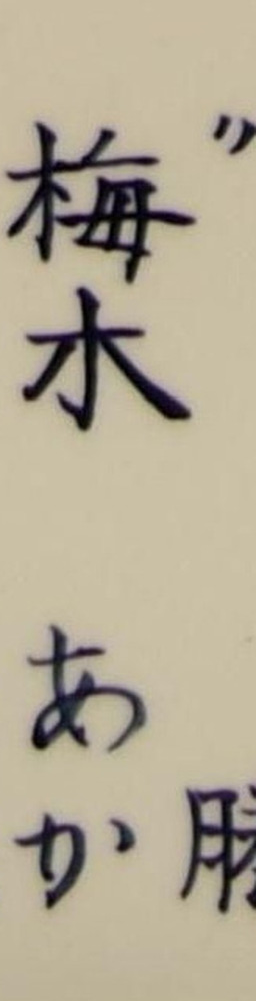梅木あか
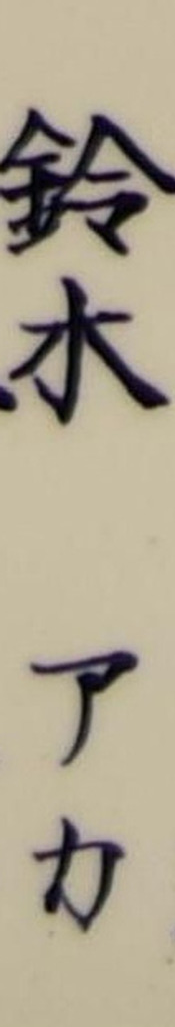鈴木アカ
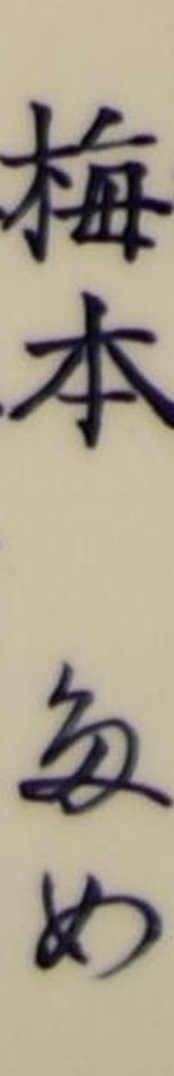梅本ため
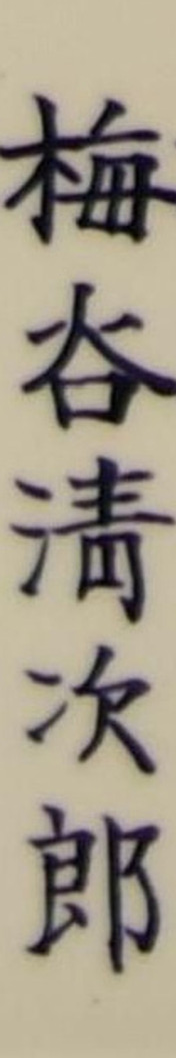梅谷清次郎
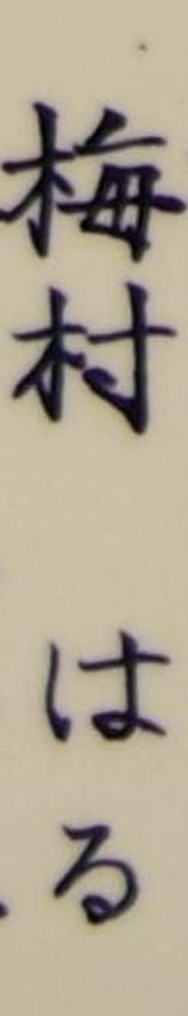梅村はる
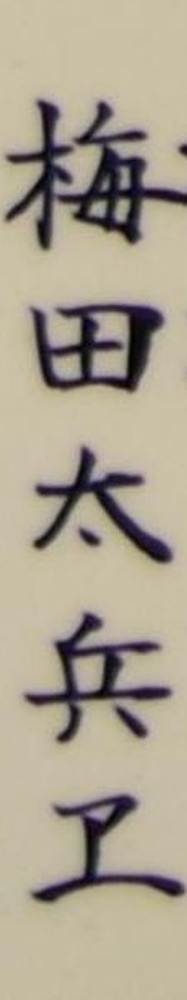梅田太兵ヱ
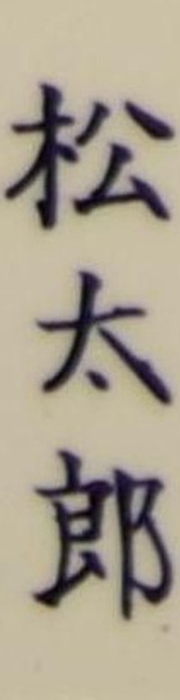松太郎
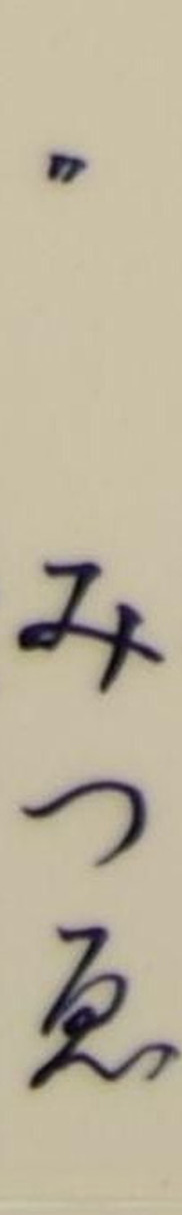みつゑ
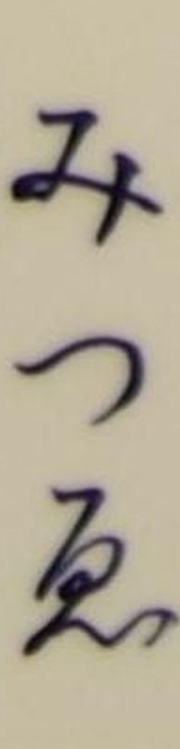みつゑ
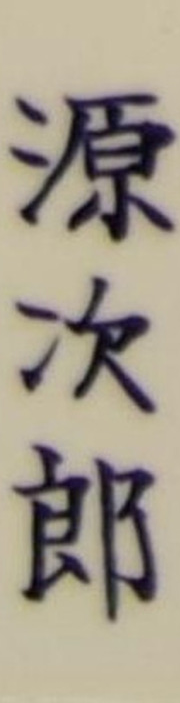源次郎
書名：A~D
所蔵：koyasan kongobuji
